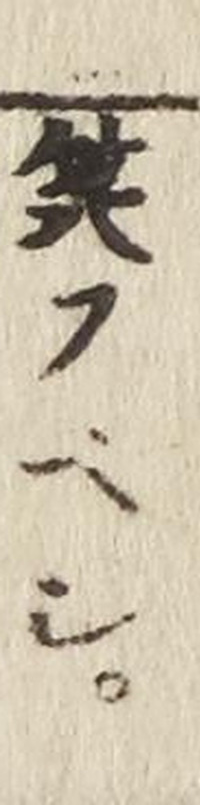笑フベシ。
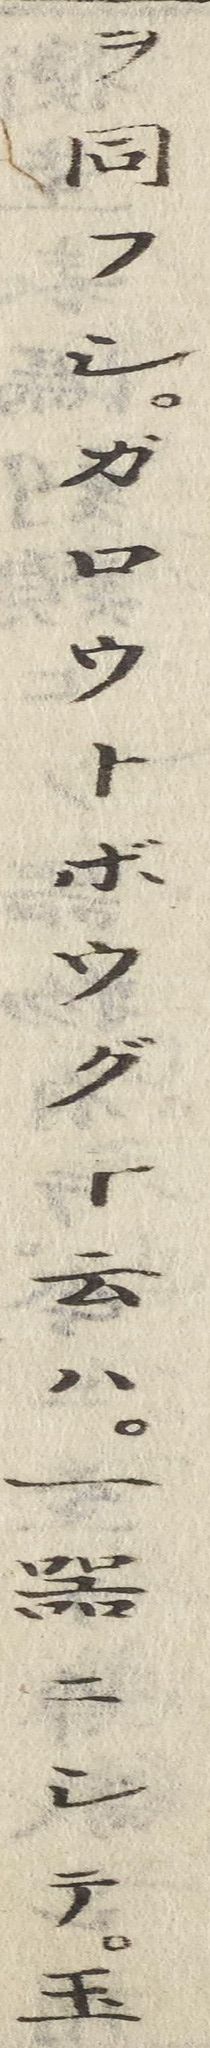ヲ同フシ。ガロウトボウグト云ハ。一器ニシテ。玉
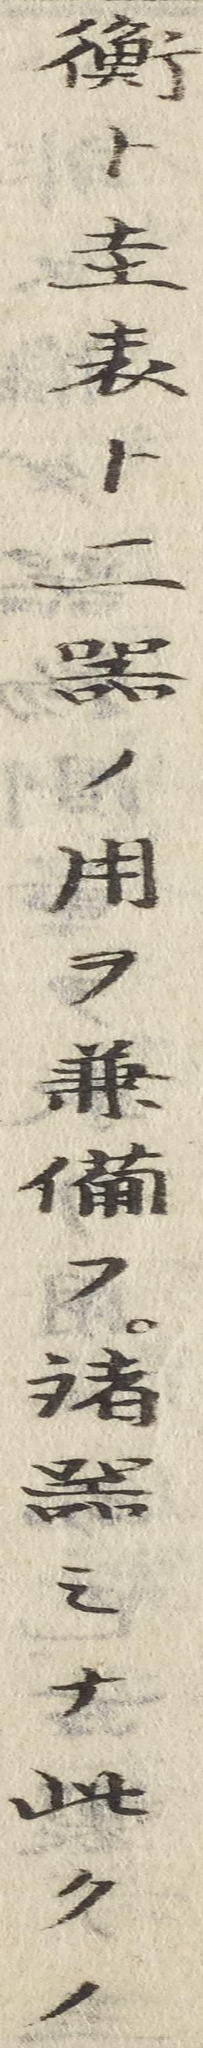衡ト圭表トニ器ノ用ヲ兼備フ。諸器ミナ此クノ
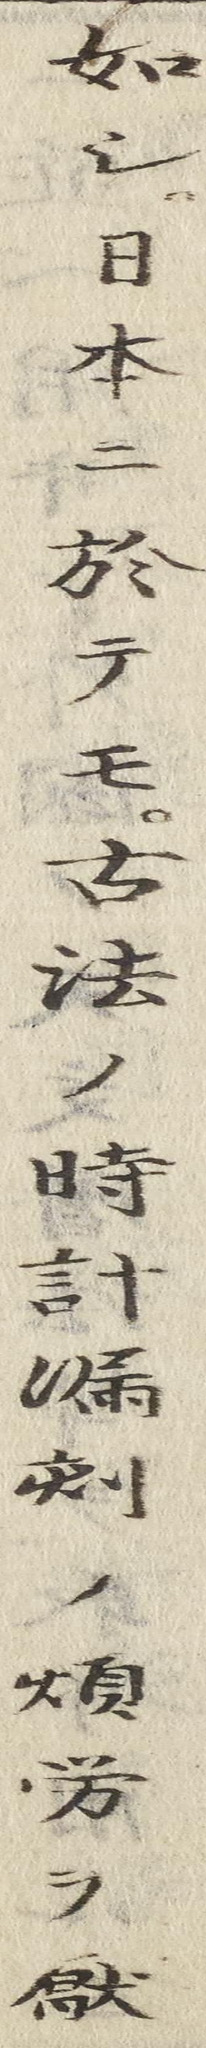如シ。日本ニ於テモ。古法ノ時計漏刻ノ煩労ヲ厭
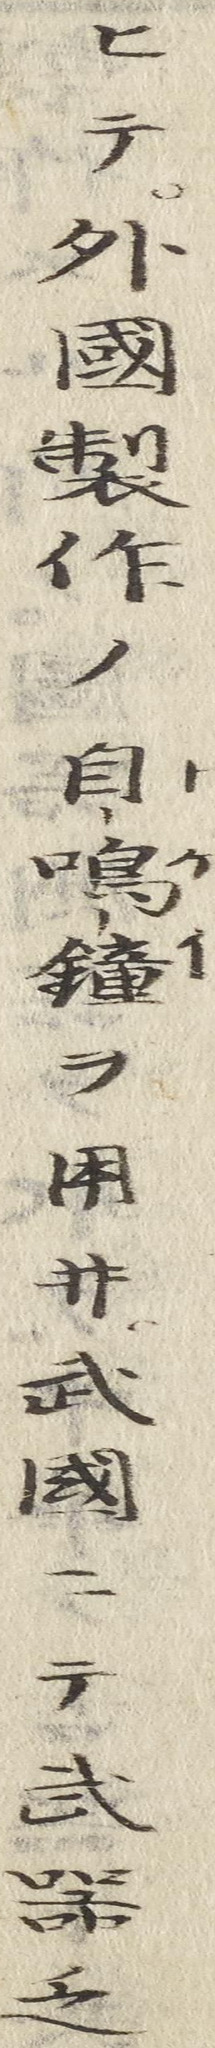ヒテ外国製作ノ自－鳴－鐘ヲ用ヰ武国ニテ武器乏
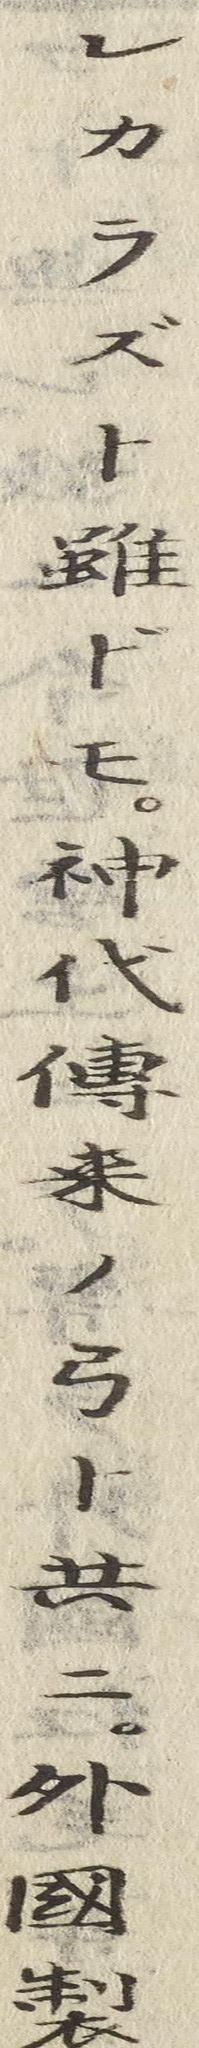シカラズト雖ドモ。神代伝来ノ弓ト共ニ。外国製
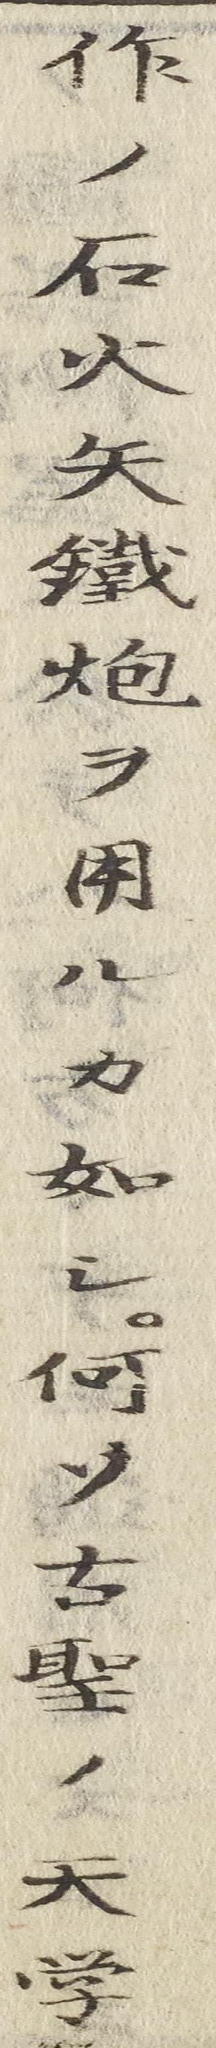作ノ石火矢鉄砲ヲ用ルカ如シ。何ソ古聖ノ天学
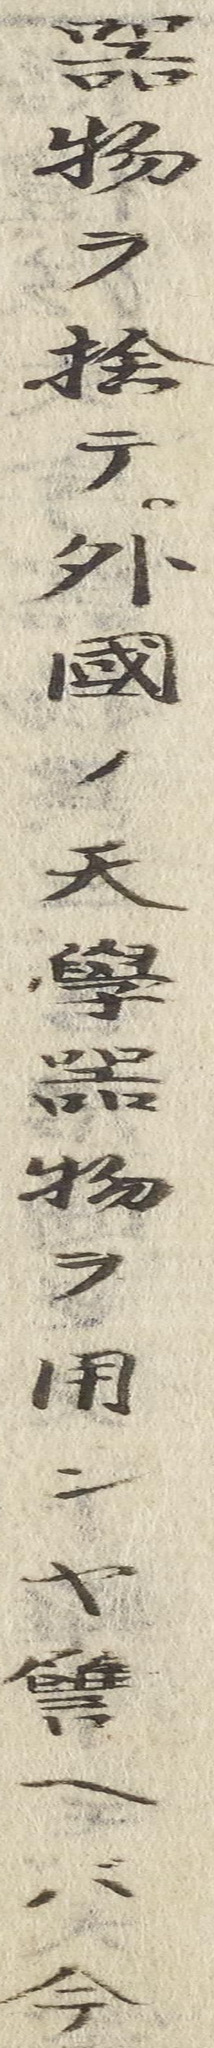器物ヲ捨テ。外国ノ天学器物ヲ用ンヤ譬ヘバ今
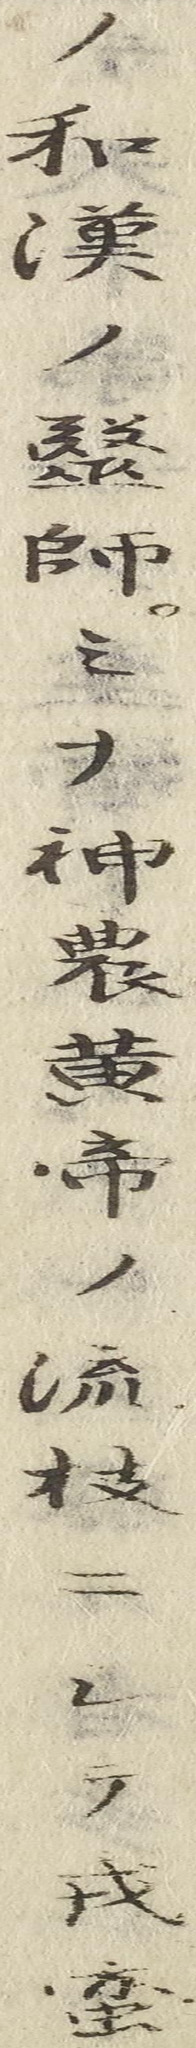ノ和漢ノ医師。ミナ神農黄帝ノ流技ニシテ戌蛮
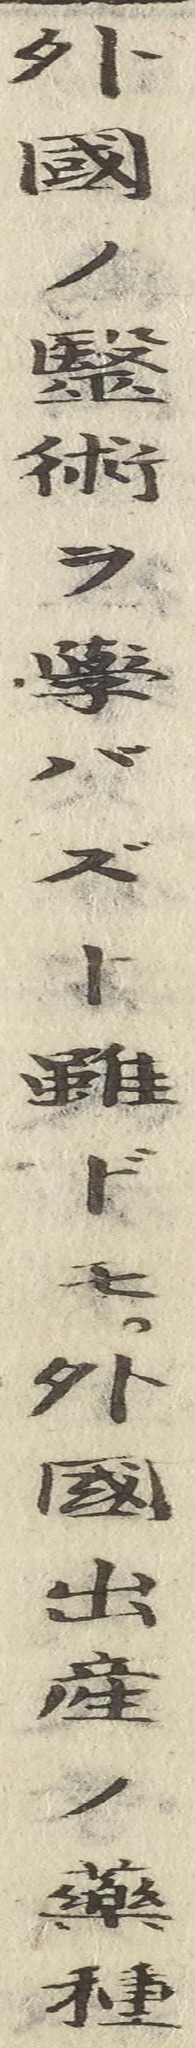外国ノ医術ヲ学バズト雖ドモ。外国出産ノ薬種
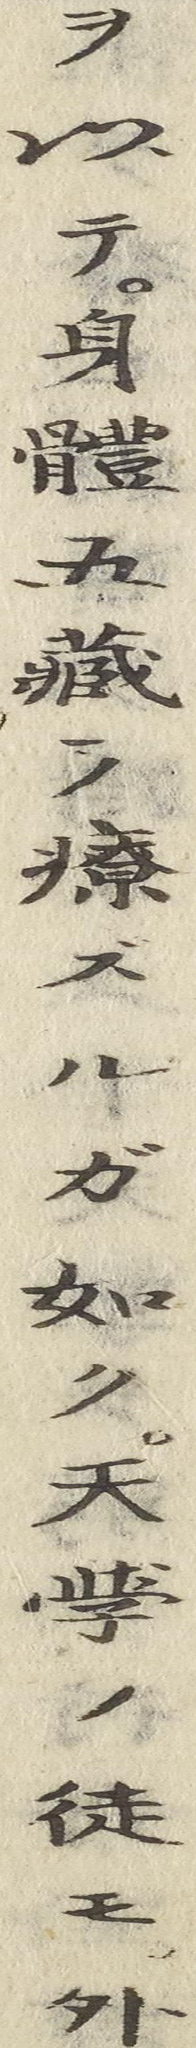ヲ以テ。身体五臓ノ療ズルガ如ク。天学ノ徒モ外
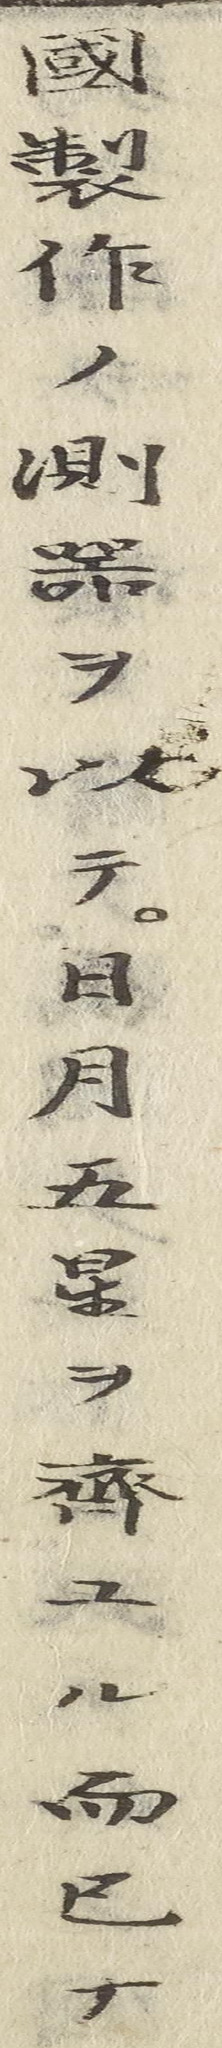国製作ノ測器ヲ以テ。日月五星ヲ齊ユル而己ナ
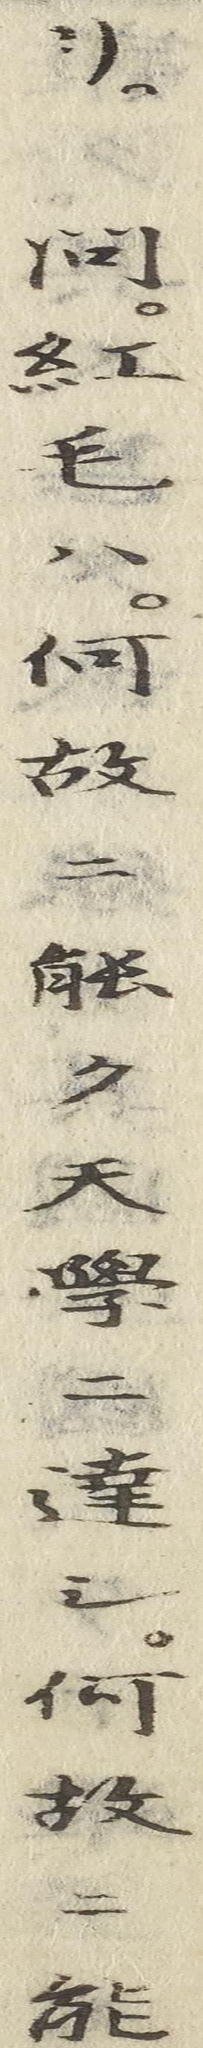リ。問。紅毛ハ。何故ニ能ク天学ニ達シ。何故ニ能
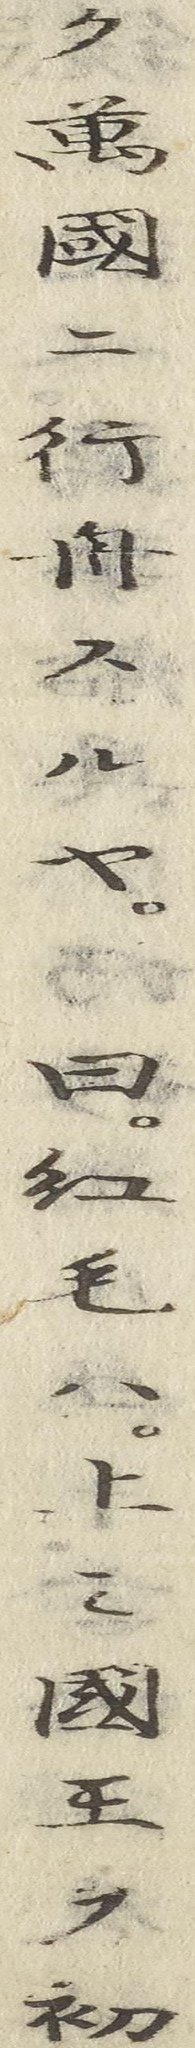ク万国ニ行舟スルヤ。曰。紅毛ハ。上ニ国王ヲ初
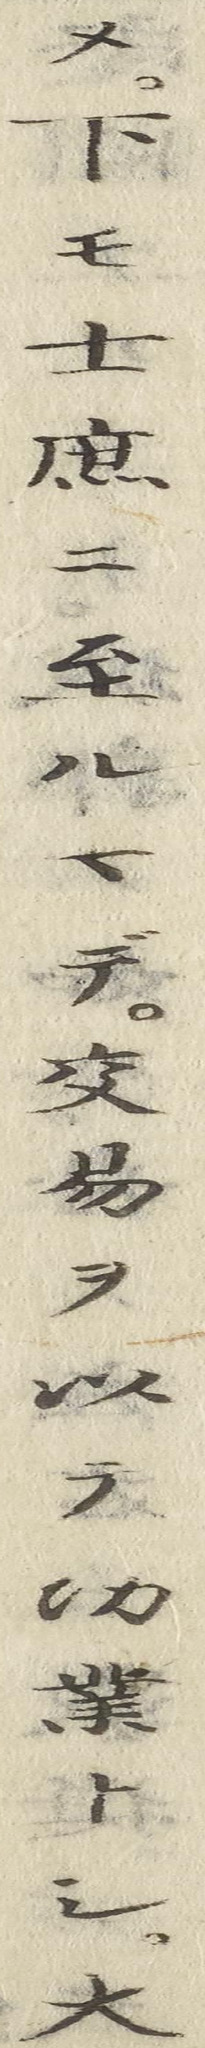メ。下モ士庶ニ至ルマデ。公易ヲ以テ功業トシ。大
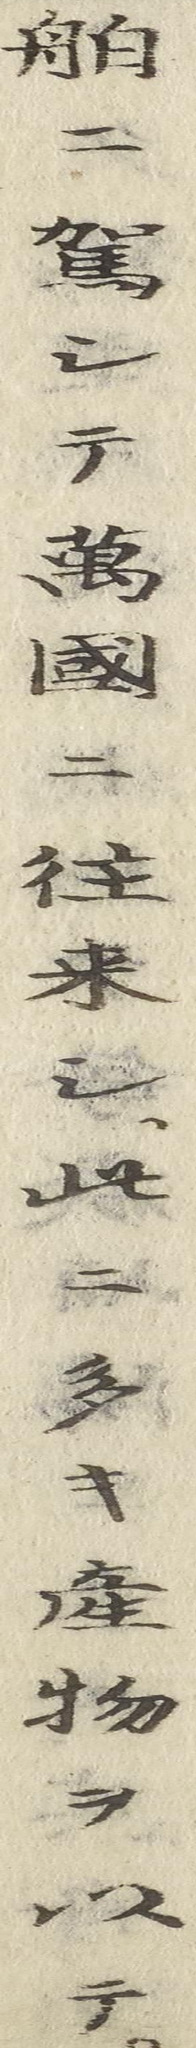舶ニ駕シテ万国ニ往来シ。此ニ多キ産物ヲ以テ。
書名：大略天学名目鈔　天經或問附録
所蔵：東京大学地震研究所図書室 Earthquake Research Institute Library, The University of Tokyo, JAPAN
